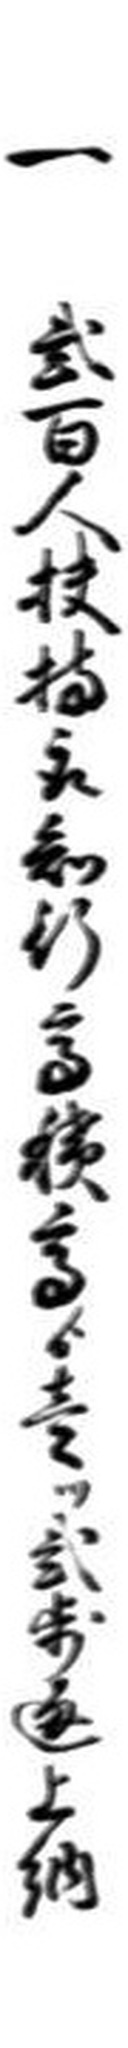一弐百人扶持取知行高積高ゟ壱ツ弐歩通上納
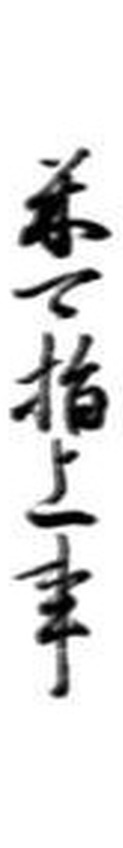米可指上事
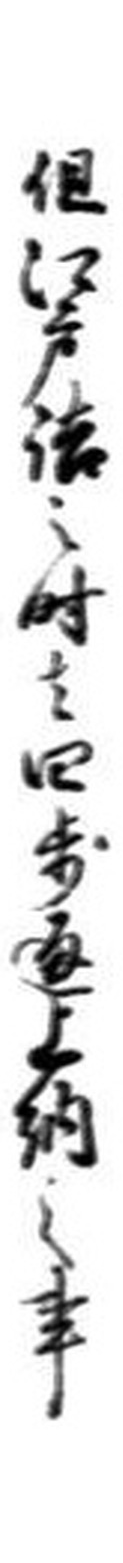但江戸詰之時者四歩通上納之事
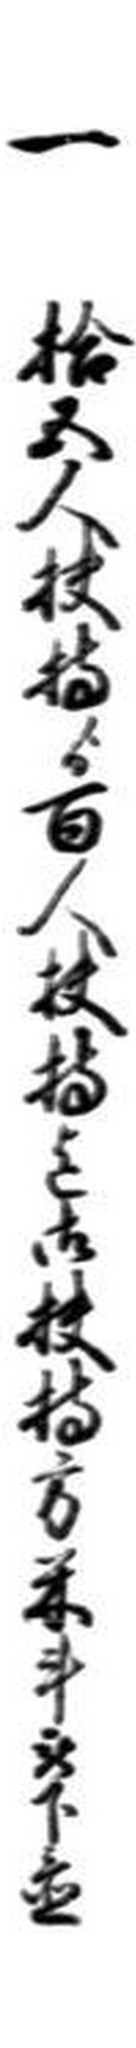一拾五人扶持ゟ百人扶持迄御扶持方米計被下置
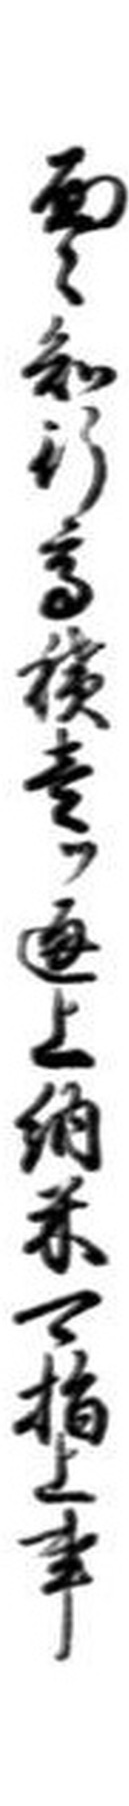面々知行高積壱ツ通上納米可指上事
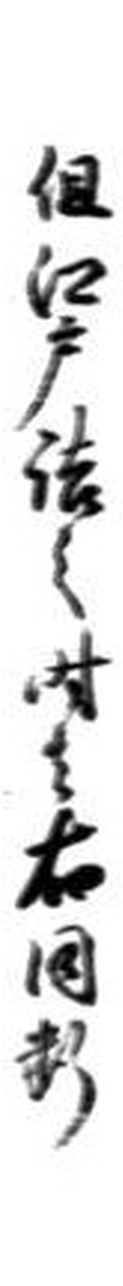但江戸詰之時者右同断
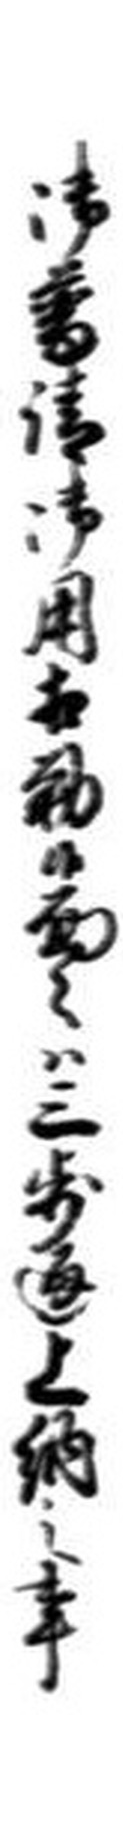御普請御用相勤候面々ハ三歩通上納之事

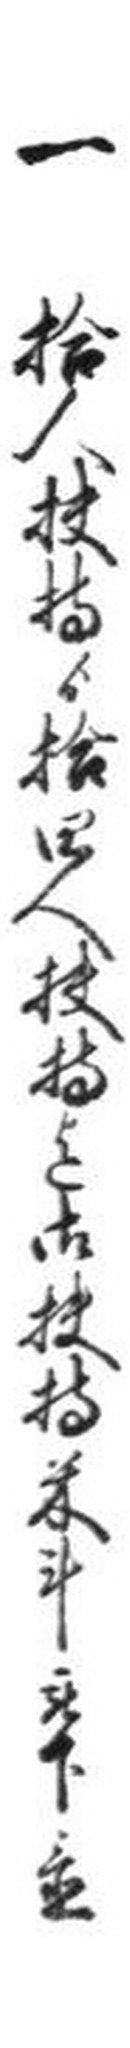一拾人扶持ゟ拾四人扶持迄御扶持米計被下置
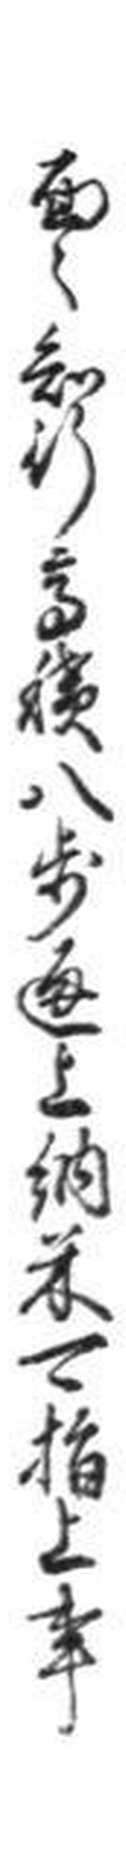面々知行高積八歩通上納米可指上事
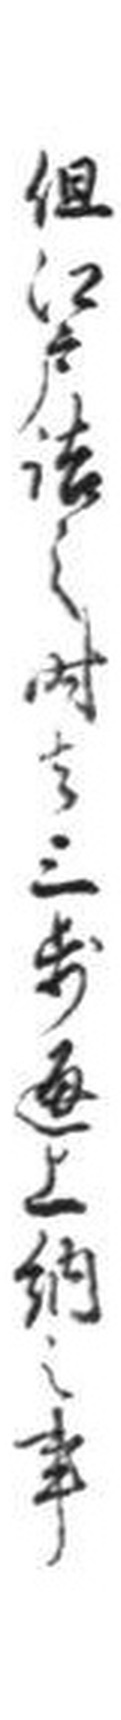但江戸詰之時者三歩通上納之事
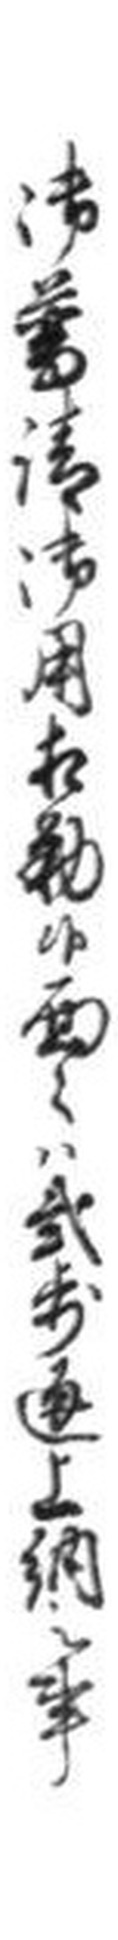御普請御用相勤候面々ハ弐歩通上納之事
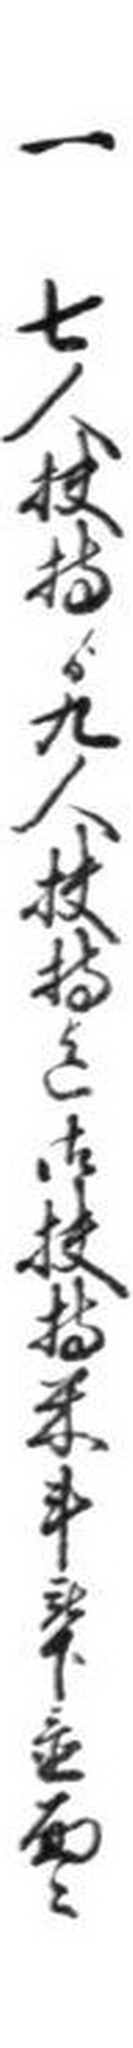一七人扶持ゟ九人扶持迄御扶持米計被下置面々ハ
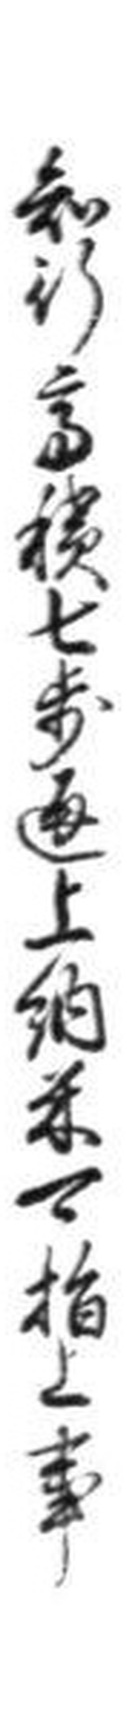知行高積七歩通上納米可指上事
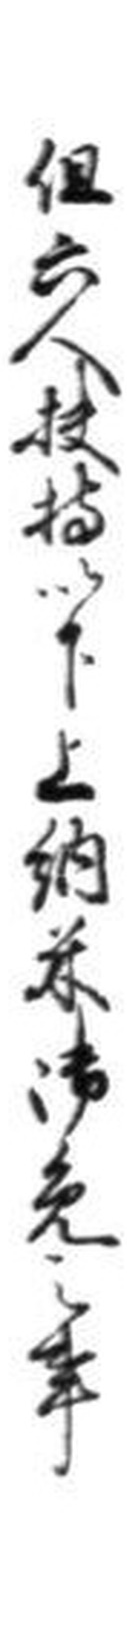但六人扶持以下上納米御免之事
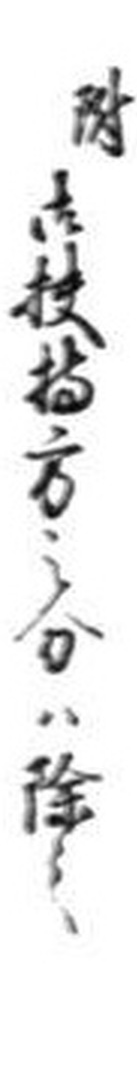御扶持方之分ハ除之
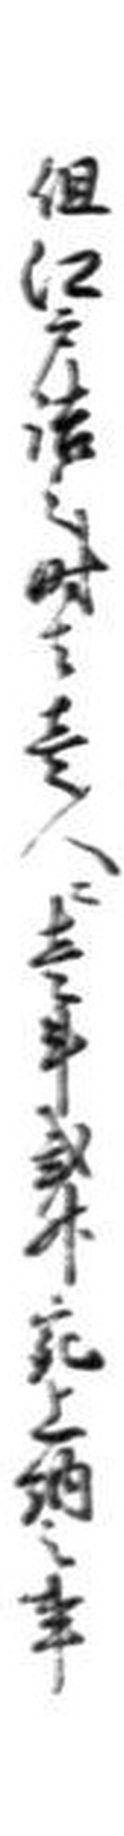但江戸詰之時者壱人ニ壱斗弐升宛上納之事
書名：家譜 三十一 吉邦公 享保元年
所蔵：福井県文書館 Fukui Prefectural Archives
